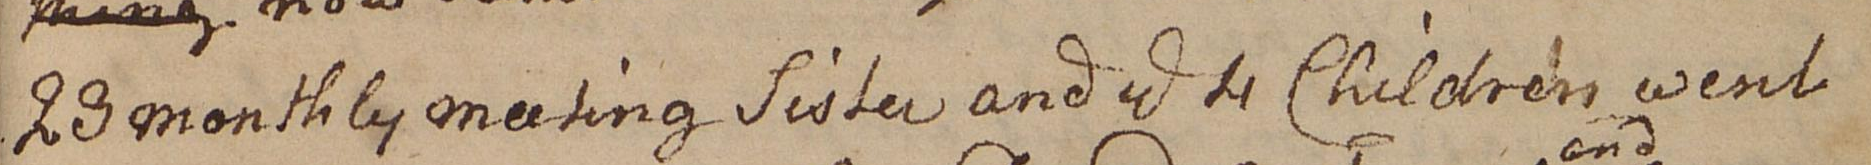23 monthly meeting Sister and y^e 4 Children went
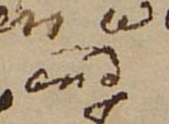and
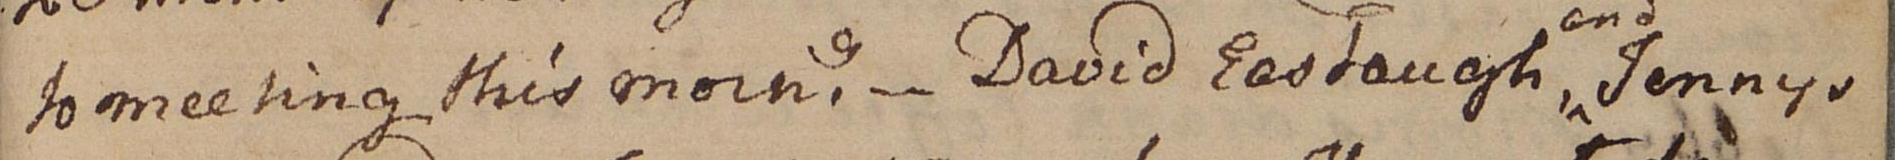to meeting this morn^g.- David Eastaugh, ^ Jennys
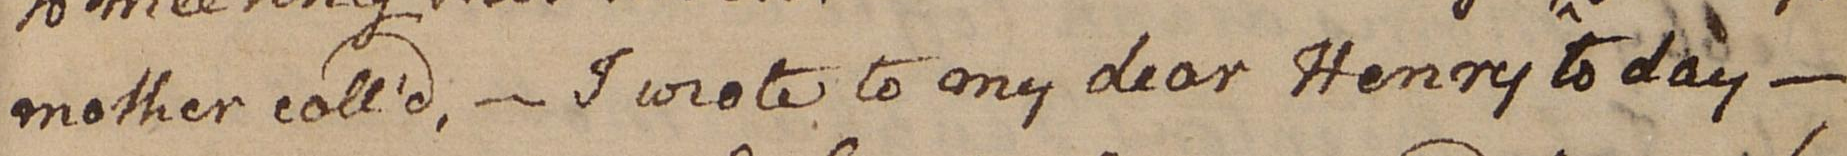mother call'd,- I wrote to my dear Henry to day-
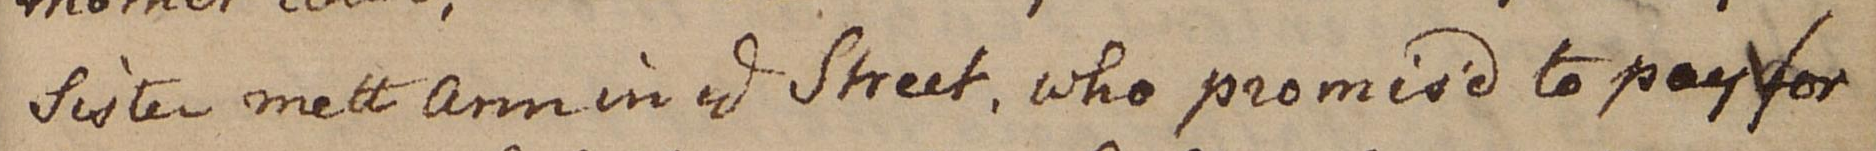Sister mett Arm in y^e Street, who promis'd to pay for
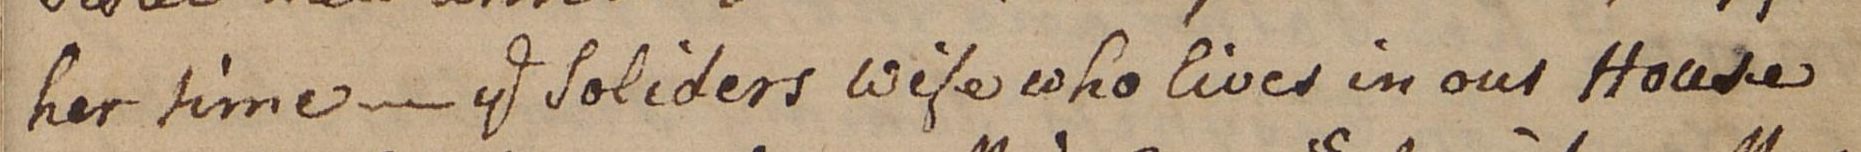her time- y^e Soliders Wife who lives in our House
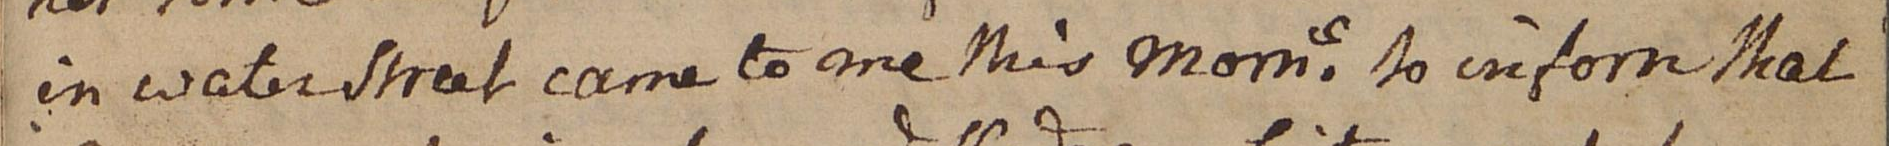in Water Street came to me this Morn^g. to inforn that
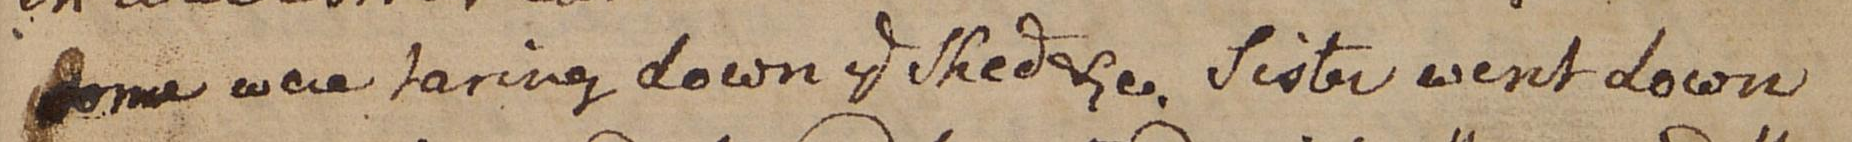[some] were taring down y^e Shed & c. Sister went down
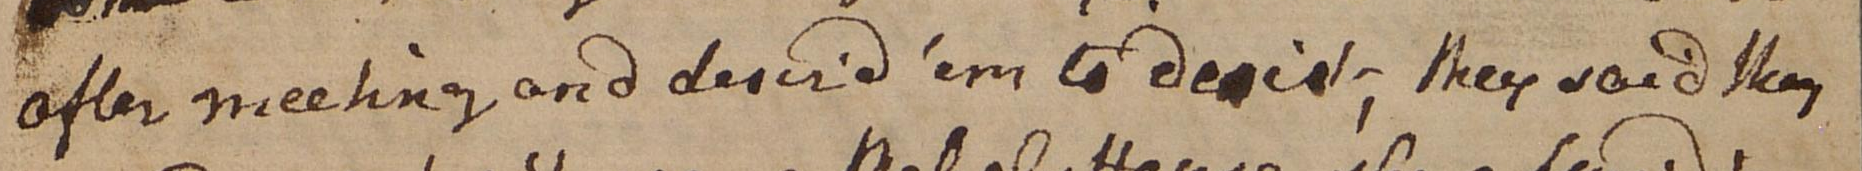after meeting and desir'd 'em to de[s]irt- they said they
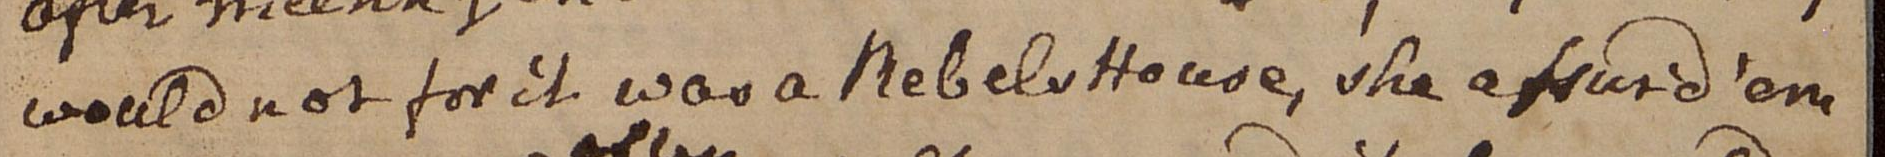would not for it was a Rebels House, she assur'd 'em
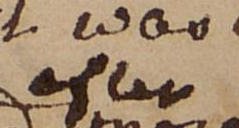after
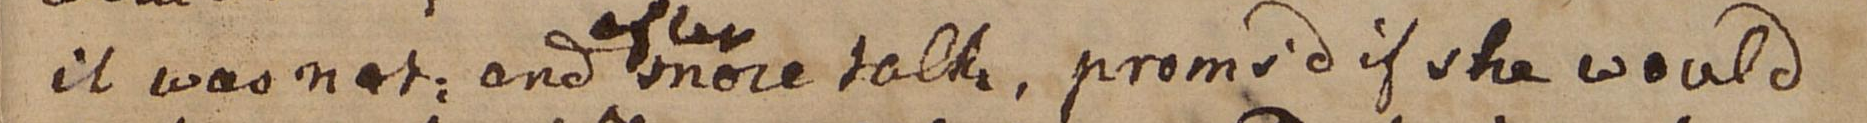it was not; and ^ more talk, proms'd if she would
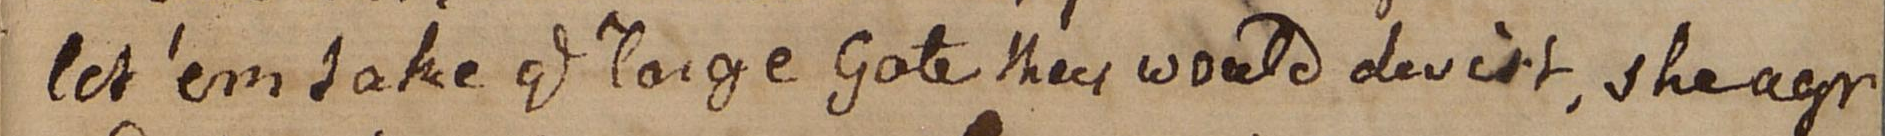let 'em take y^e large Gate they would desirt, she agr
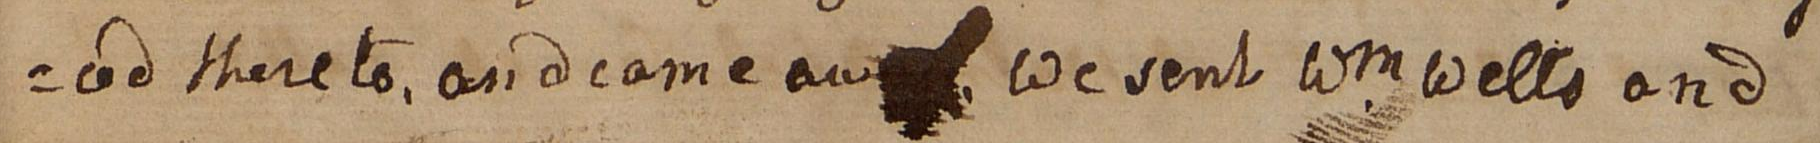-eed there to, and came aw[__] We sent W^m. Wells and
